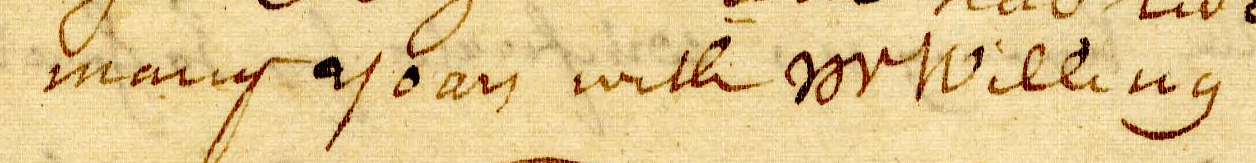many years with Mr Willing
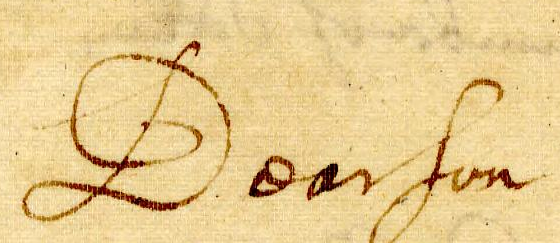Dear son
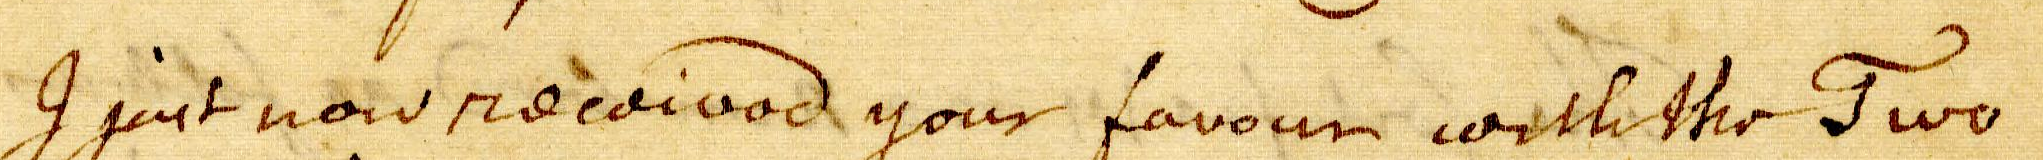I just now received your favour with the Two
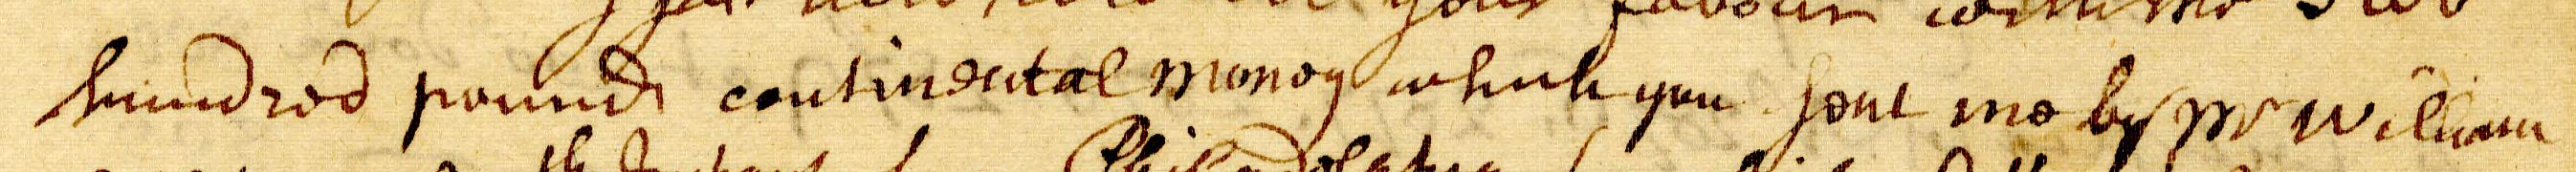hundred pounds continental money which you sent me by M^r William
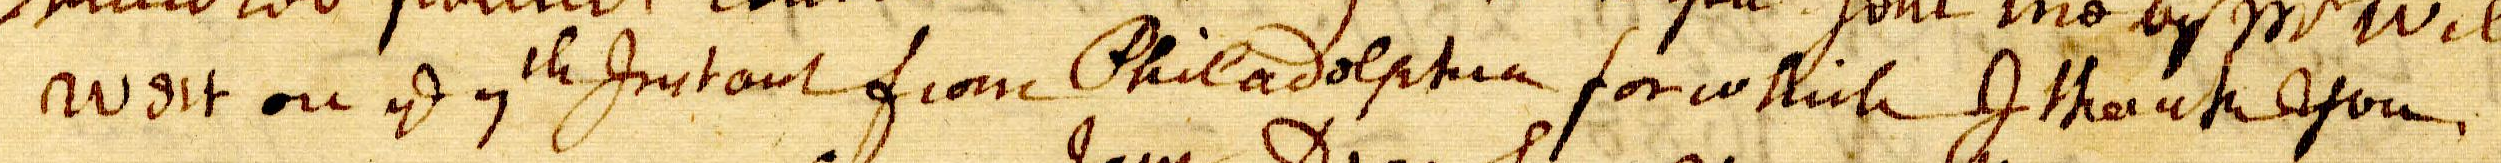West on y^e 7^th Instant from Philadelphia for which I thank you.
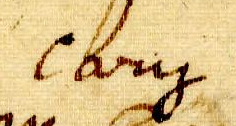Cary
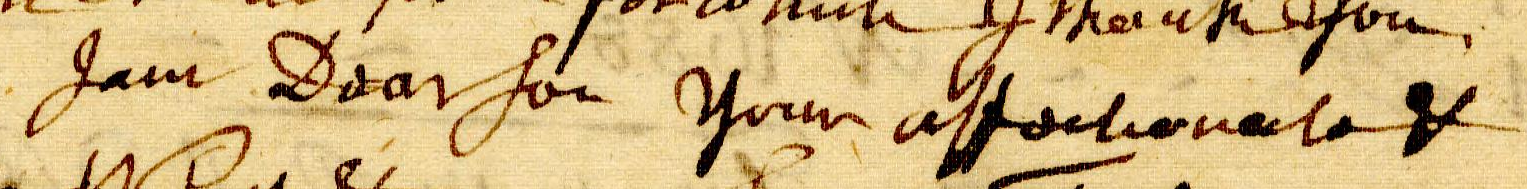Iame Dear Son Your affectionate &
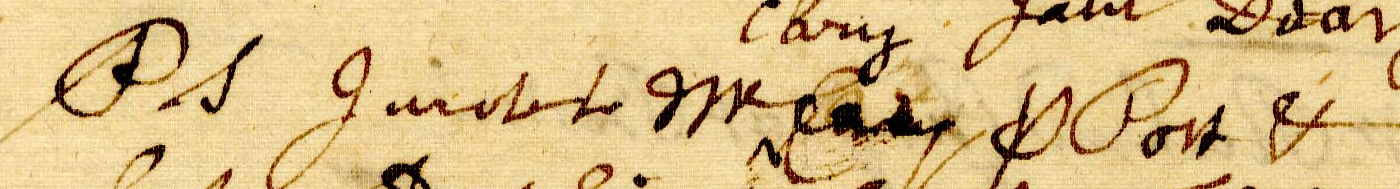PS I wrote to M^r ^ [___] per Post &
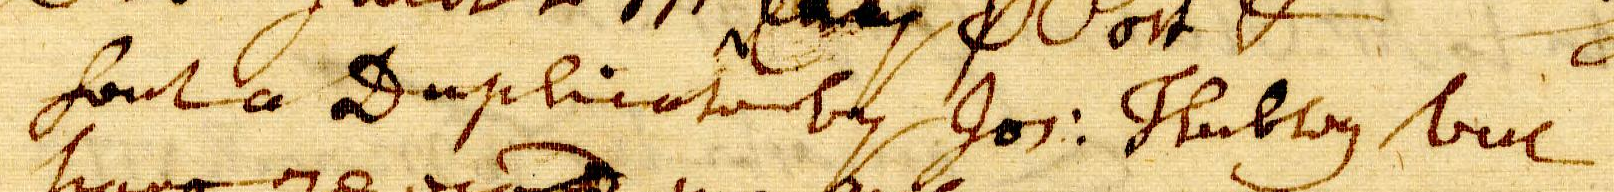sent a Duplicate by Jos: Hubly but
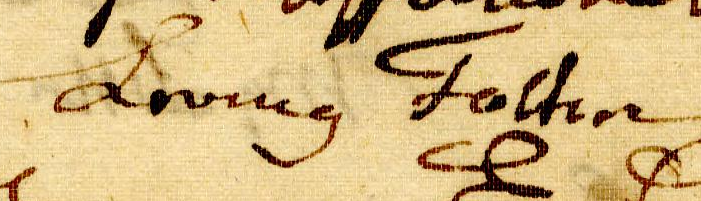Loving Father
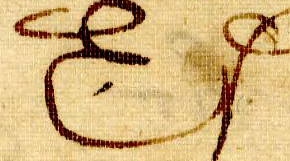ES
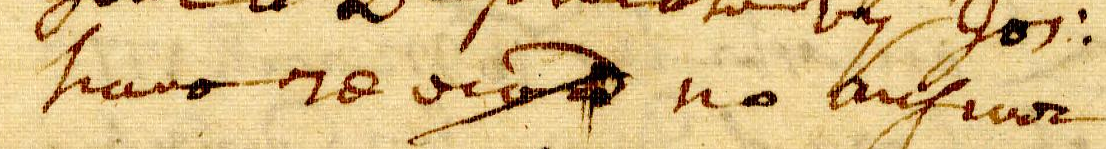have receved no answer
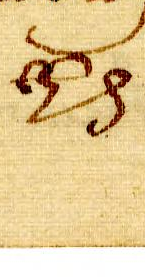ES
